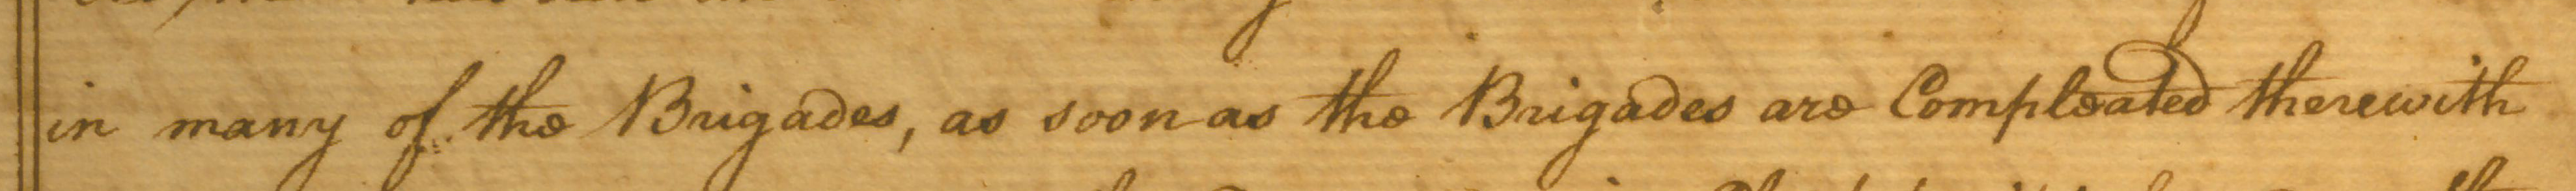in many of the Brigades, as soon as the Brigades are Compleated therewith
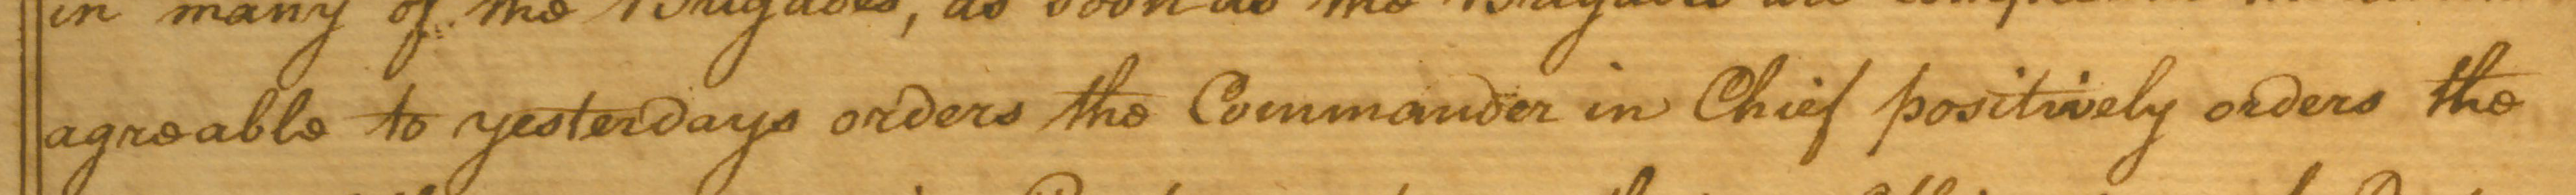agreable to yesterdays order the Commander in Chief positively orders the
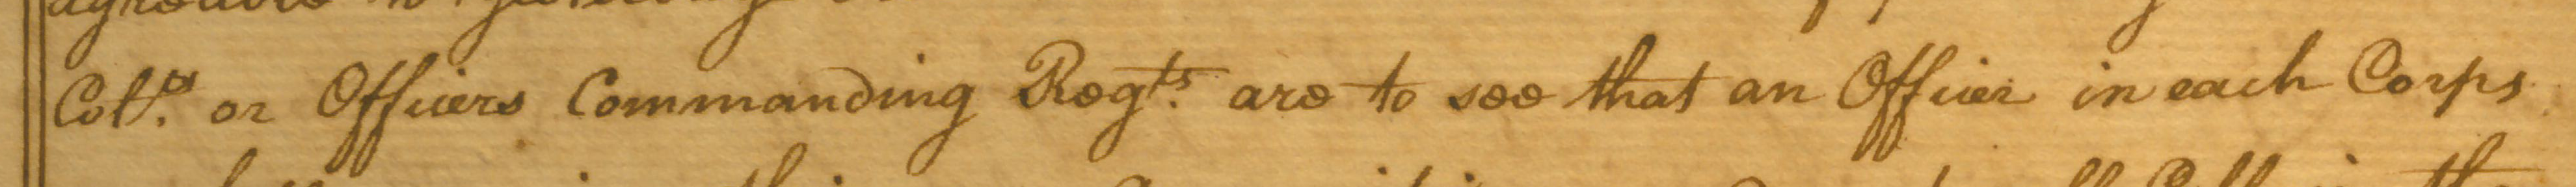Col^o. or Officers Commanding Reg^ts. are to see that an Officer in each Corps
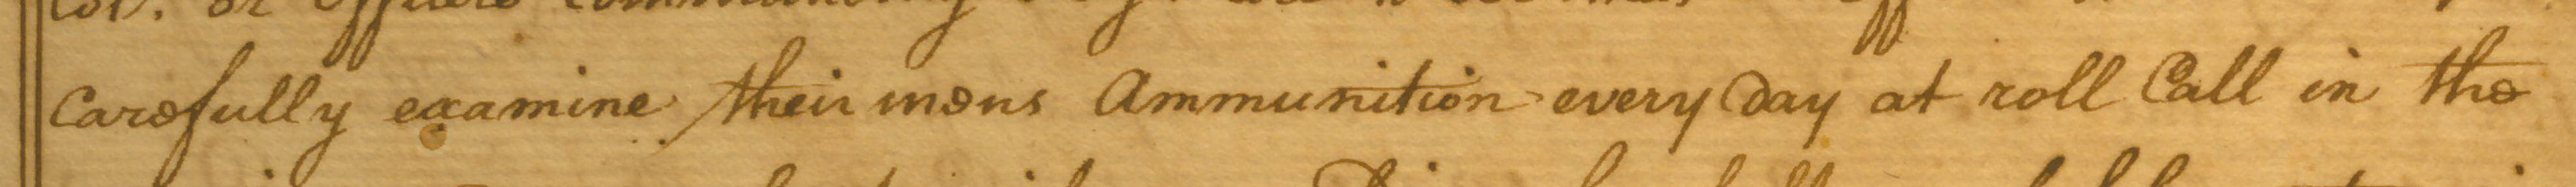carefully examine their mens Ammunition every day at roll Call in the
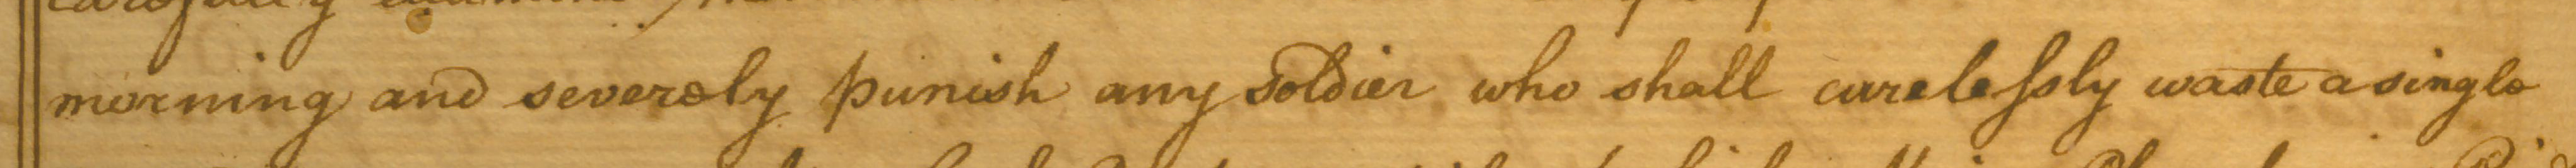morning and severely punish any soldier who shall carelessly waste a single
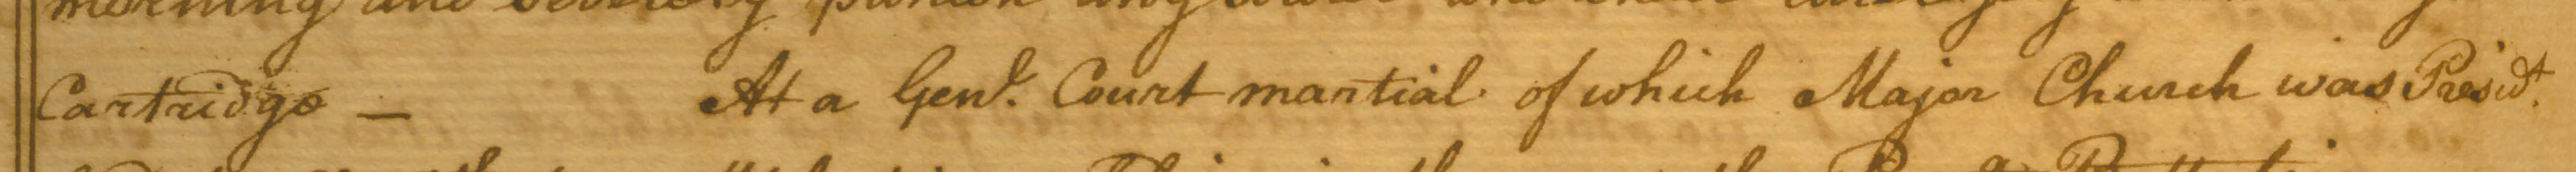Cartridge- At a Gen^l. Court martial of which Major Church was Presid^t.
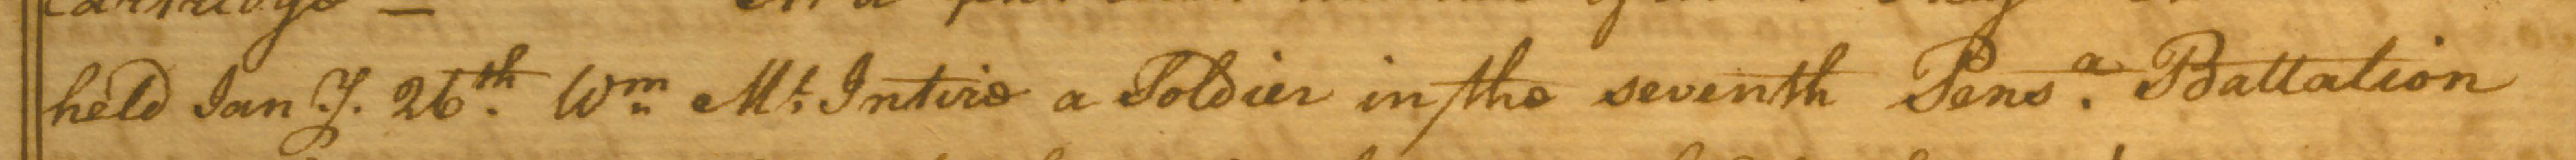held Jan^y. 26^th. W^m. M^c.Intire a Soldier in the seventh Pens^a. Battalion
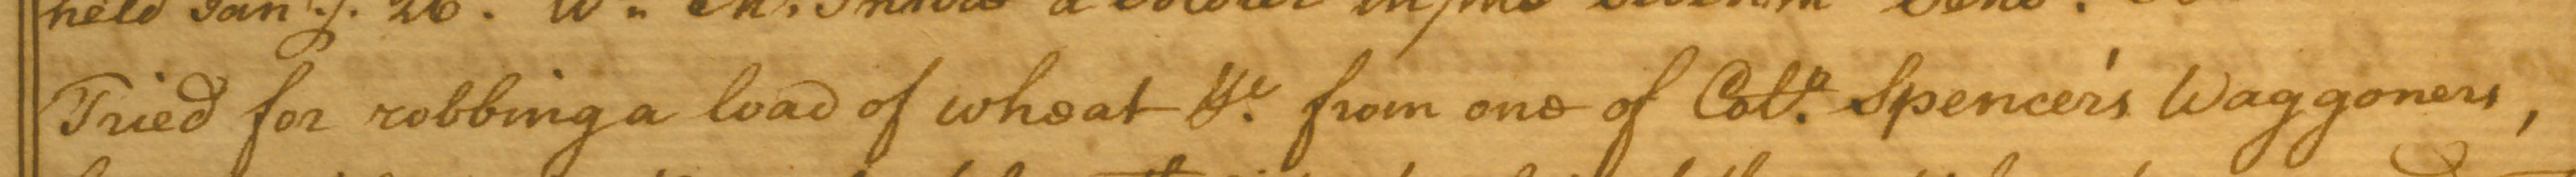Tried for robbing a load of wheat &c. from one of Col^o. Spencer's Waggoners,
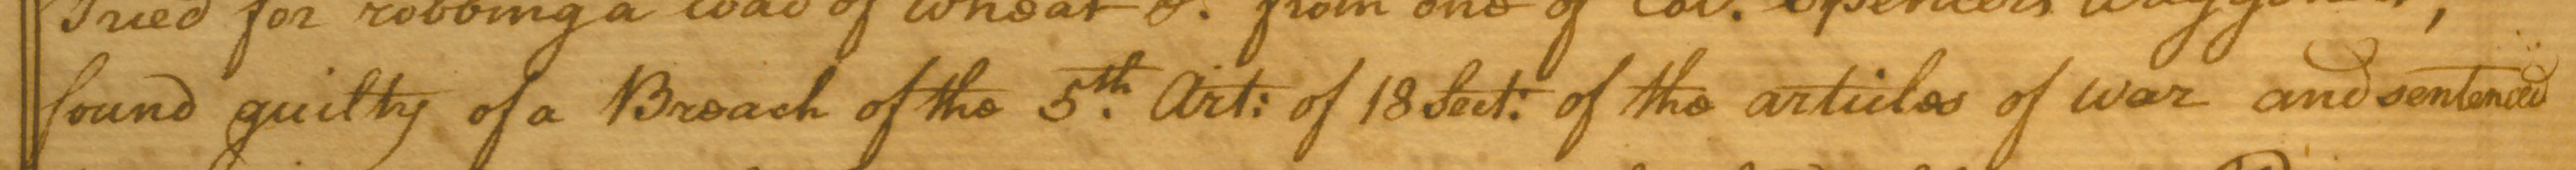found guilty of a Breach of the 5^th. Art: of 18 Sect: of the articles of war and sentenced
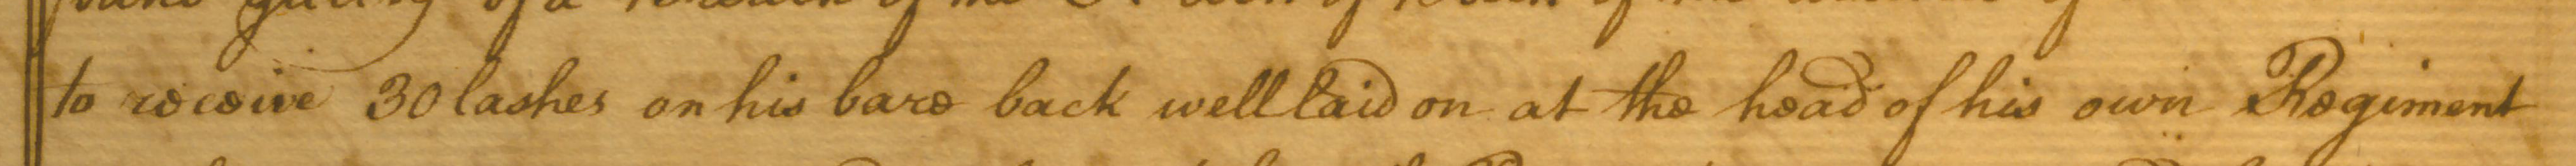to receive 30 lashes on his bare back well laid on at the head of his own Regiment
